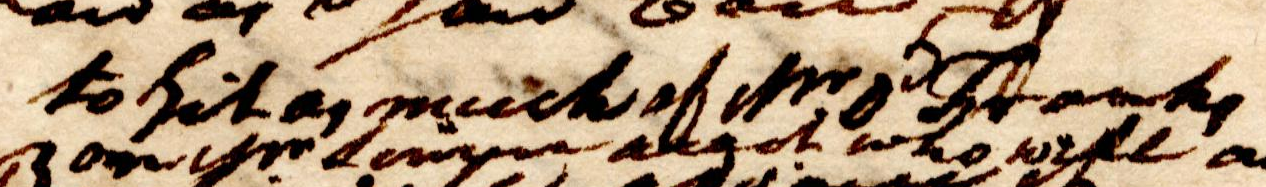to Git as much of M^r D Franks
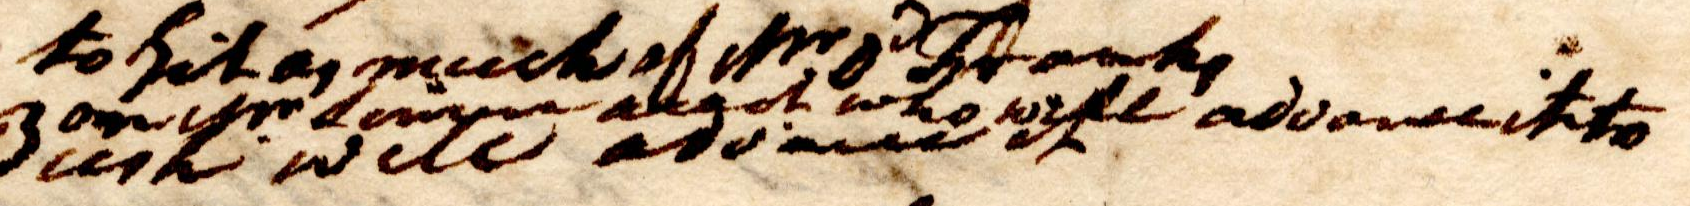on M^r. Simon accot. who will advance it to
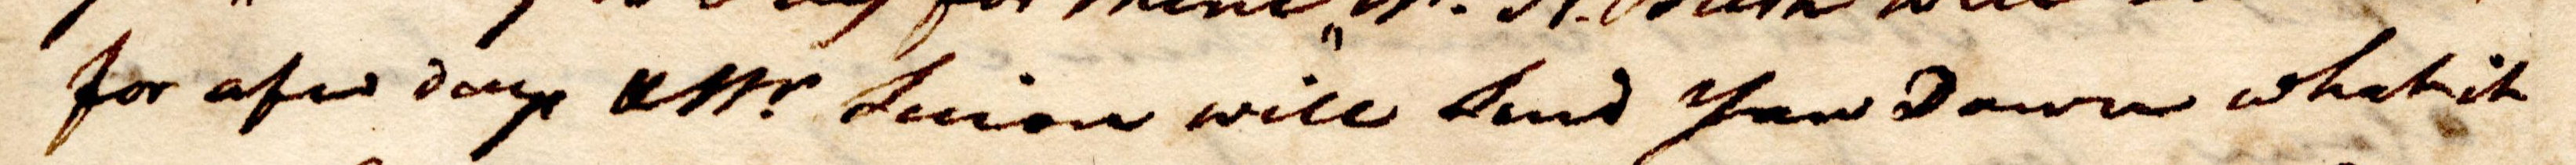for a few days & M^r Simon will send you down what it
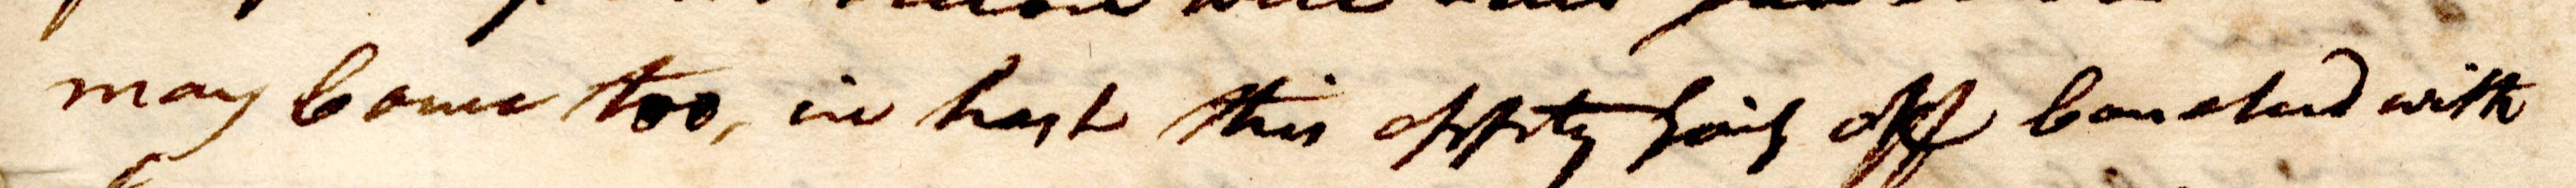may Care too, in last this opp^ty Going off Can stand with
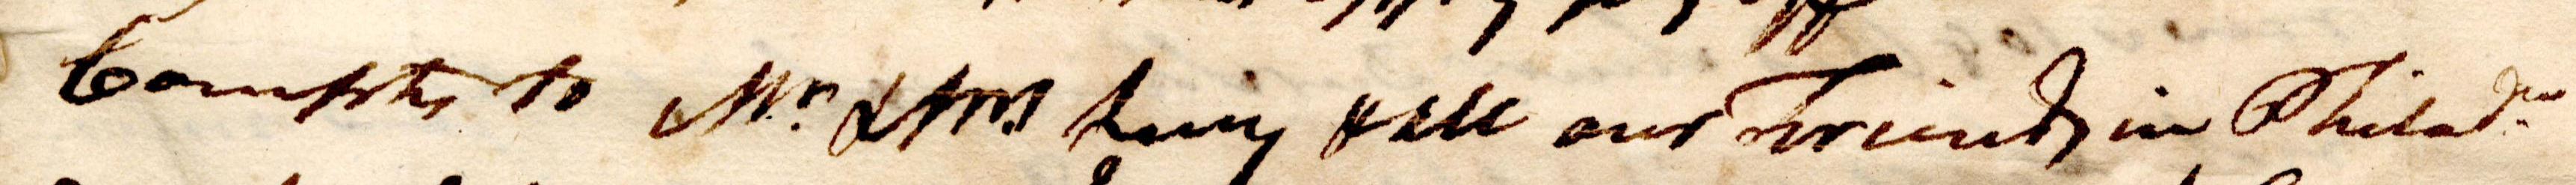Comp^ts to M^r & M^rs Levy & all or friends in Philad^a
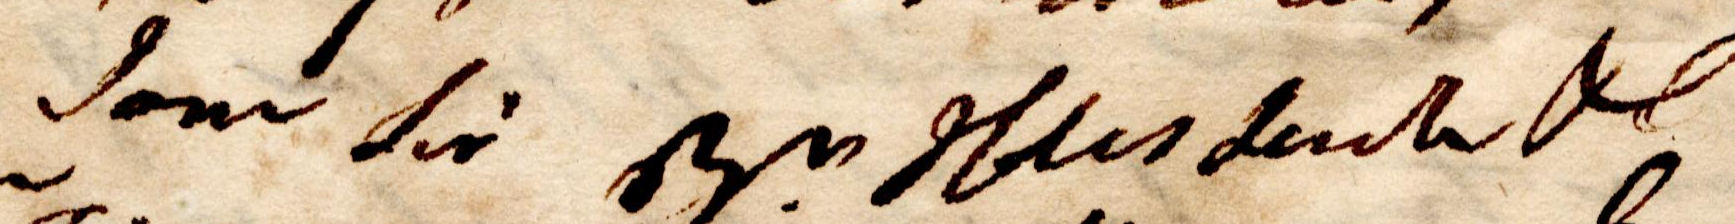I am sir y^r. Hbe Sert &
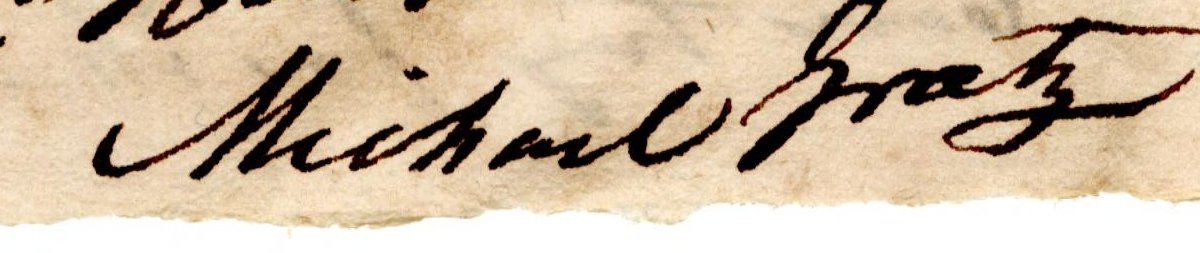Michael Gratz
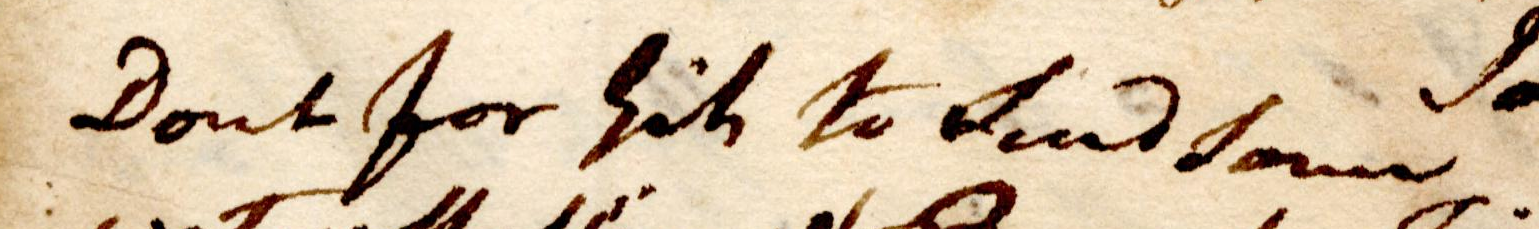Dont forgit to Send Some
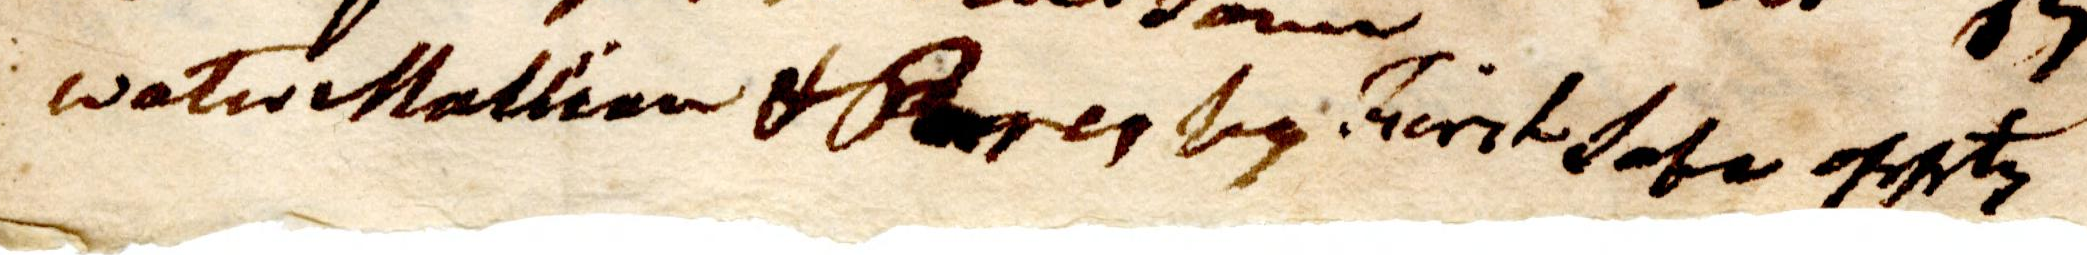water Mallion & pores by first Safe opp^ty
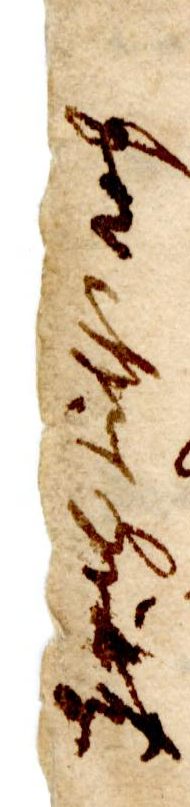for M^r Gratz
